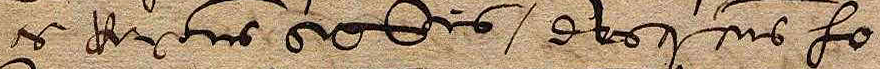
as Rezõees seguj̄tes / das quaes ho
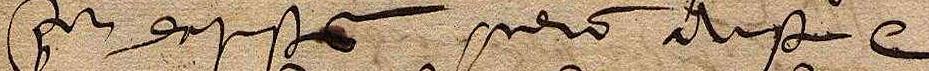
ptor da Justa pedio a vista e
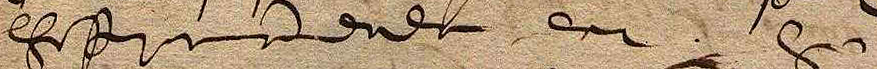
lhe foy mādada dar . djo
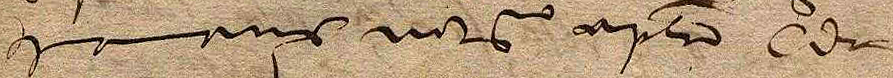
trauaços notro aplco e da
